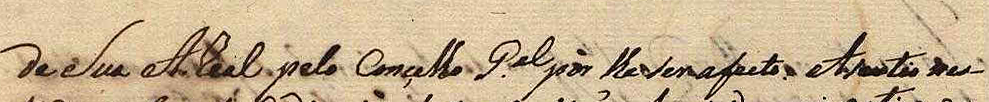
de Sua A Real pelo Concelho G.al por lhe ser afecto. Asestio nes
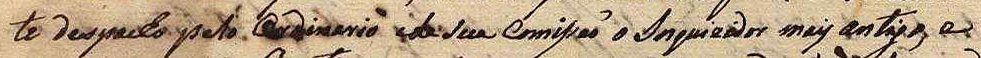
te despacho pelo Ordinario e de sua comissaõ o Inquizidor mais antigo, e
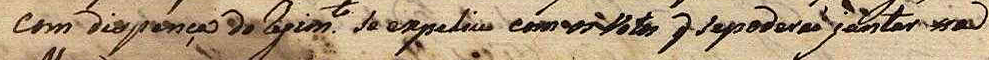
com dispença do Regim.to se expeliu com os Votos q̄ se poderaõ juntar na
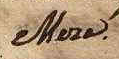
Meza.
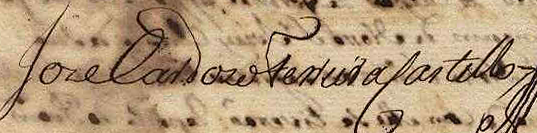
Joze Cardozo Ferreira Castello
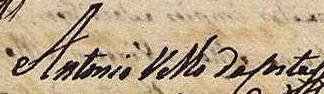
Antonio Velho da Costa
